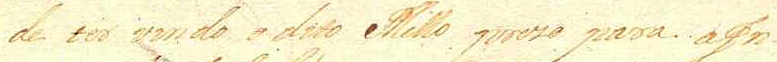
de ter vindo o dito Mello prezo para a Jn
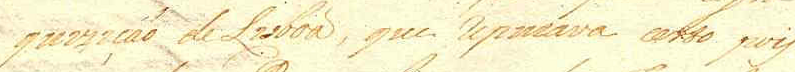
quiziçaõ de Lisboa, que Reputava certo pois
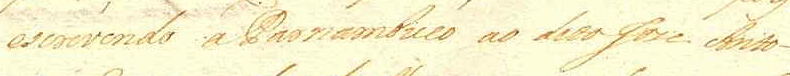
escrevendo a Parnambuco ao dito Joze Anto
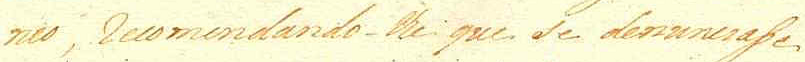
nio, Recomendando-lhe que se denunciasse
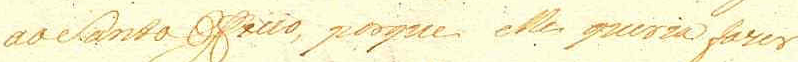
ao Santo Officio, porque elle queria fazer
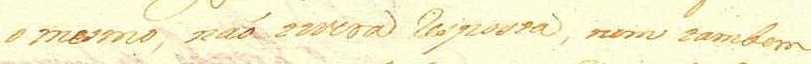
o mesmo, naõ tivera Resposta, nem tambem
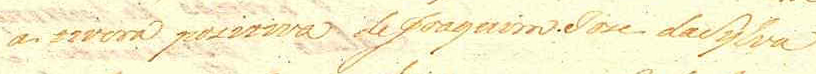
a tivera por viuva de Joaquim Ioze da Sylva
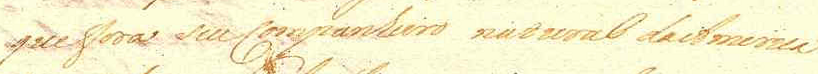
que fora seu Companheiro natural da America
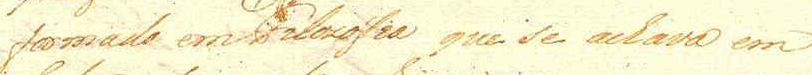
formado em Filozofia que se achava em
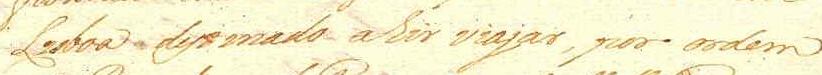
Lisboa destinado a hir viajar por ordem
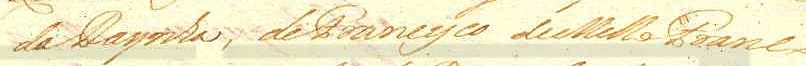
da Raynha, de Francisco de Mello Franco
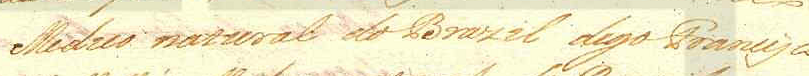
Medico natural do Brazil digo Francisco
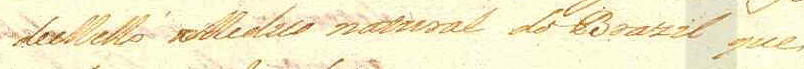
de Mello Medico natural do Brazil e
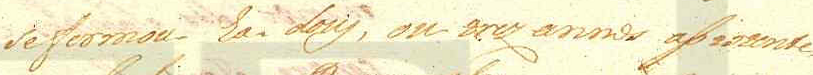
se formou ha dous, ou tres annos assistente
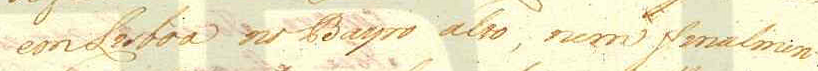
em Lisboa no Bayro alto, nem finalmen
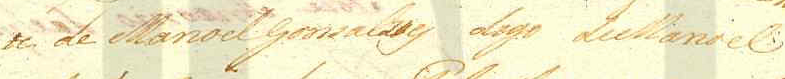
te de Manoel Gonsalves digo de Manoel
